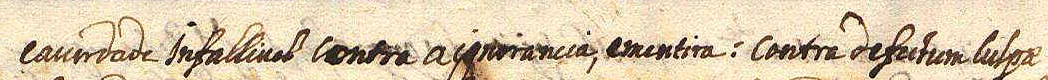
e a uerdade Infalliuel contra a ignorancia, e mentira: contra defectum Culpa
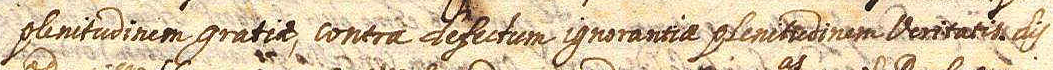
plenitudinem gratiæ, contra defectum ignorantiæ plenitudinem Veritatis. dis
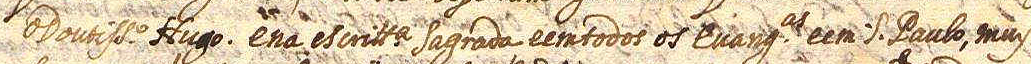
o Doutiss.o Hugo. e na escritt.a Sagrada, e em todos os Euang.os e em S. Paulo, muy
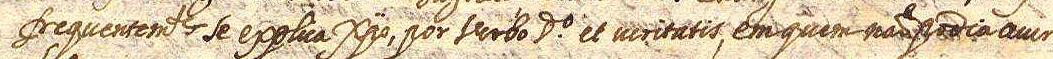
frequentemte se explica xp̄o, por verbo D.o et ueritatis, em quem naõ podia a uir
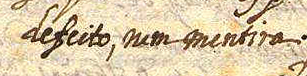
defeito, nem mentira.
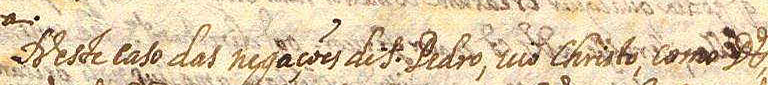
Neste caso das negações de S. Pedro, uio Christo, como Ds̄
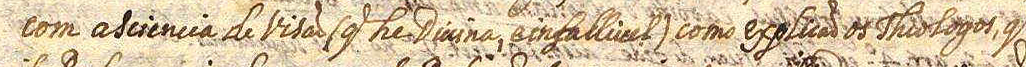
com a sciencia de Visaõ, q̄ he Diuina, e infalliuel / como explicão os Theologos, q̄
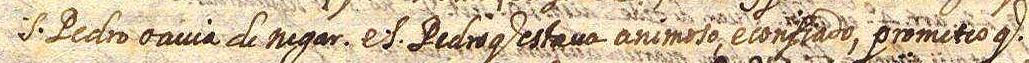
S. Pedro o auia de negar. e S. Pedro q̄ estaua animoso, e confiado, prometeo q̄.
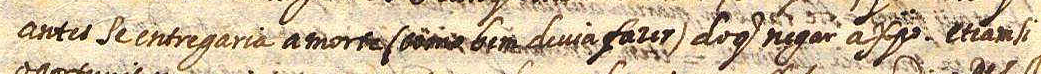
antes se entregaria a morte (como bem deuia fazer) do q̄ negar a Xp̄o. etiamsi
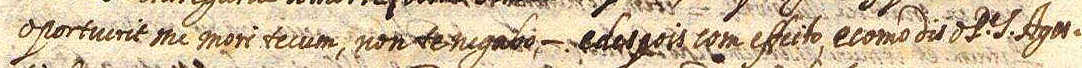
oportuerit me mori tecum, non te negabo - e despois com effeito, e como dis o P.e S. Agos
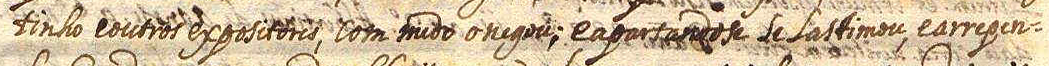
tinho e outros expositores, com medo o negou; e apartandose se Lastimou, e arrepen
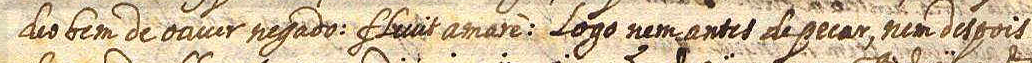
deo bem de o auer negado: fleuit amare: Logo nem antes de pecar, nem despois
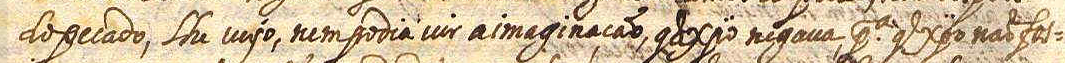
do pecado, lhe ueyo, nem podia uir a imaginaçaõ, qdo xp̄o negaua p.a q̄ xp̄o naõ fos
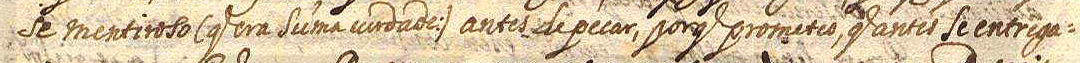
se mentiroso (q̄ era suma uerdade:) antes de pecar, porq̄ prometeo, q̄ antes se entrega
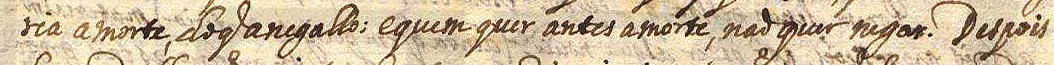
ria a morte, do q̄ a negallo: e quem quer antes a morte, naõ quer negar. Despois
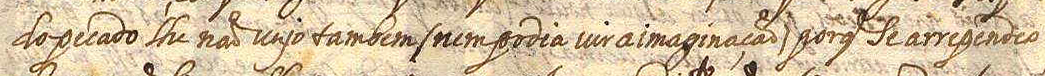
do pecado lhe naõ ueyo tambem (nem podia uir a imaginaçaõ) porq̄ se arrependeo
